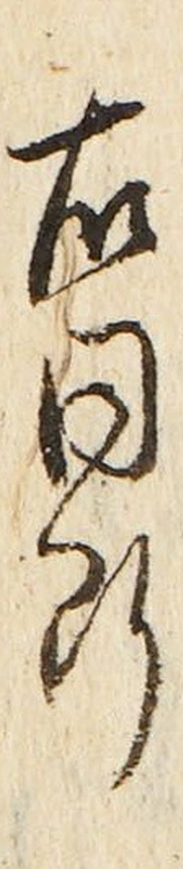右同断
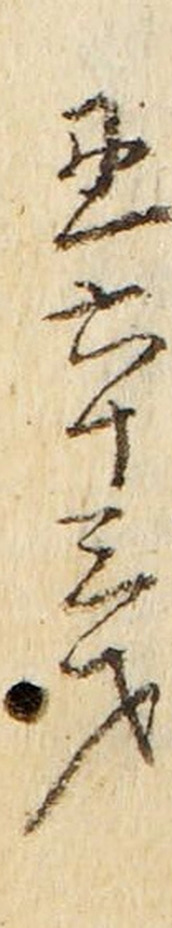丑六十三才

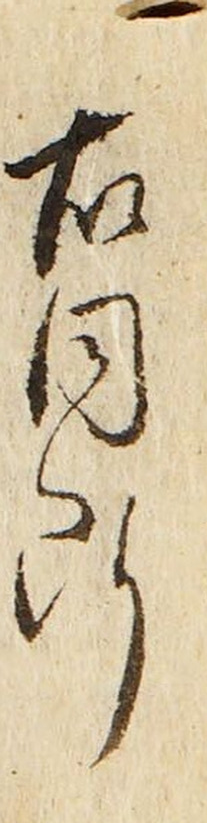右同断
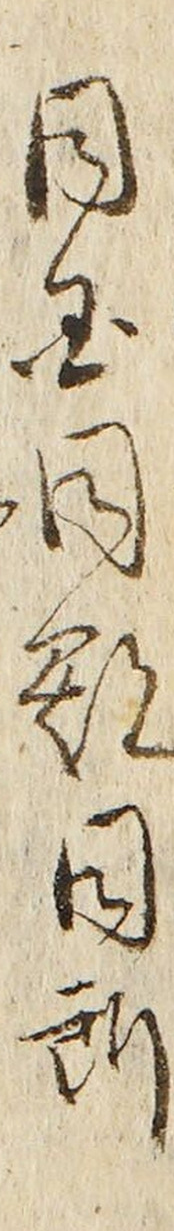同国同郡同所
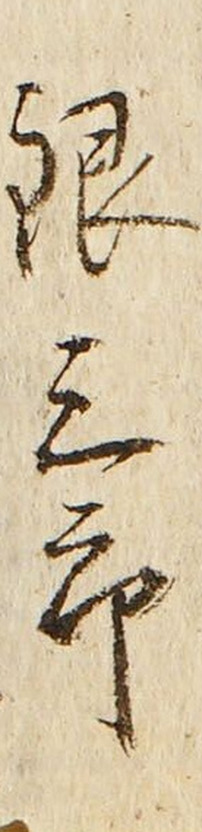銀三郎
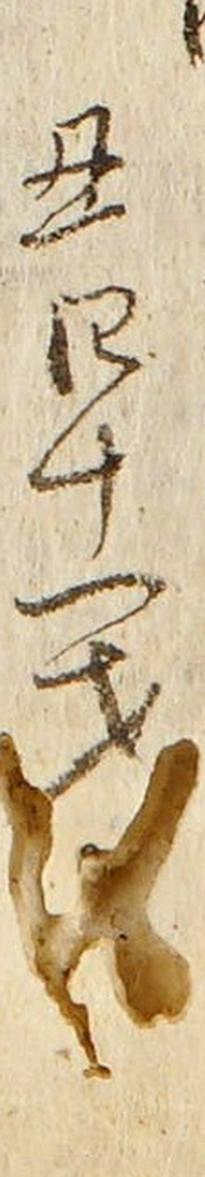丑四十一才
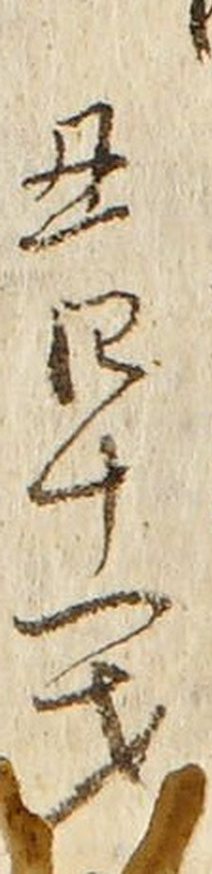丑四十一才
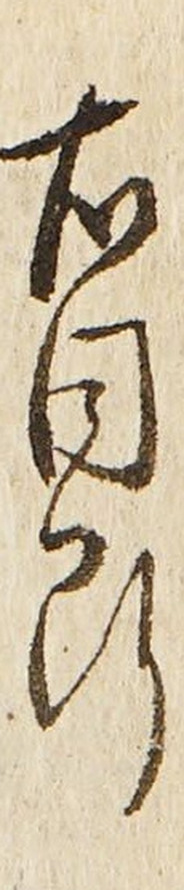右同断
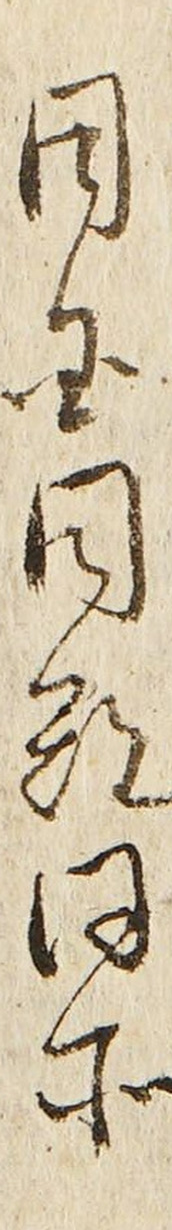同国同郡同所
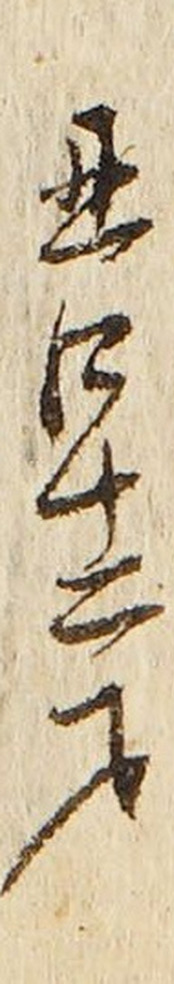丑四十二才
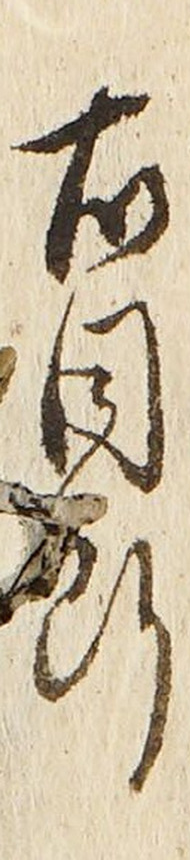右同断
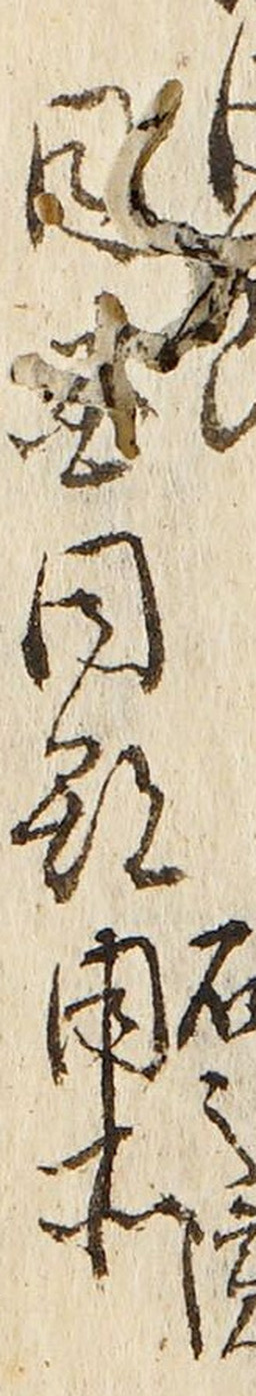同国同郡同所
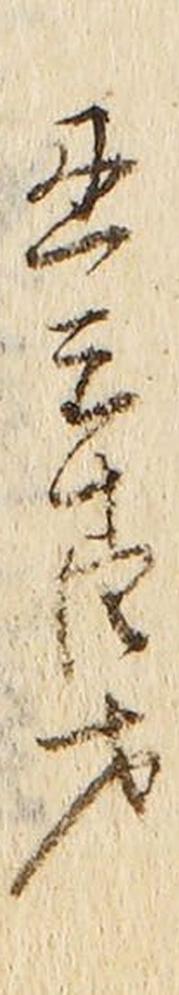丑三十四才
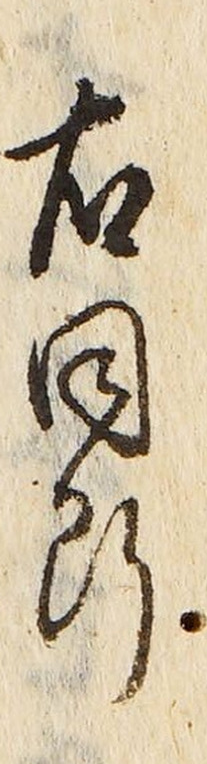右同断
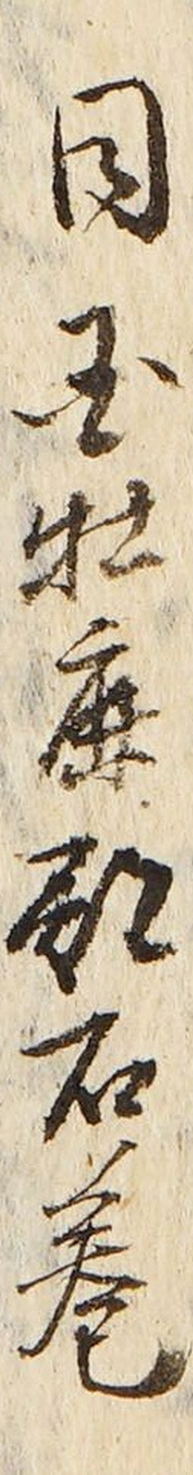同国牡鹿郡石ノ巻
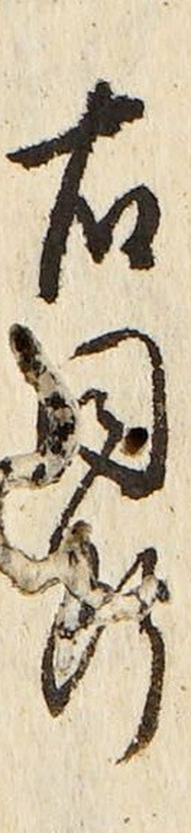右同断
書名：漂民後記
